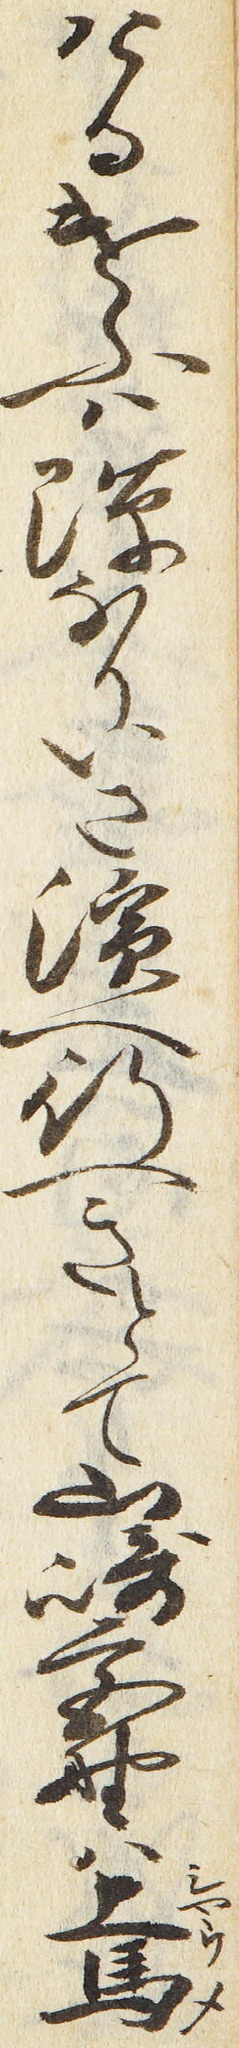けるけふハ隙なりいさ浜へ行へきとて山崎宮野ハ上馬
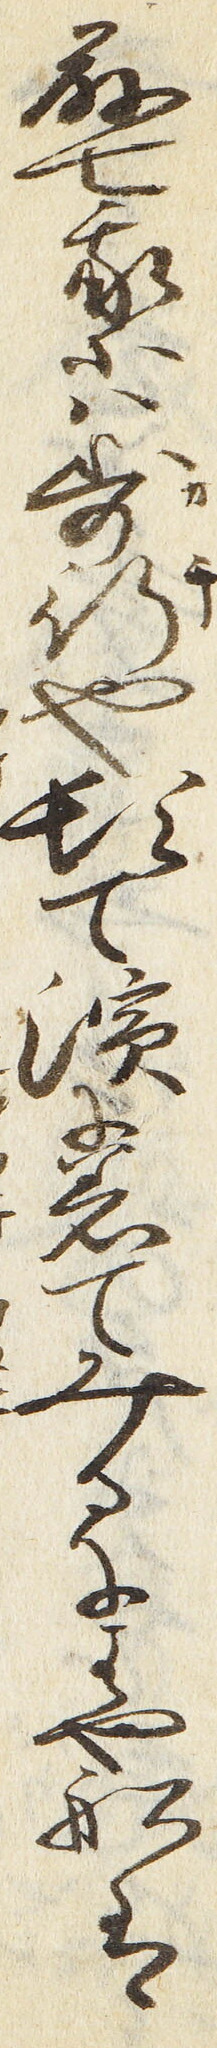藤七我等ハ歩行也頓て浜に着てみるにはや船は
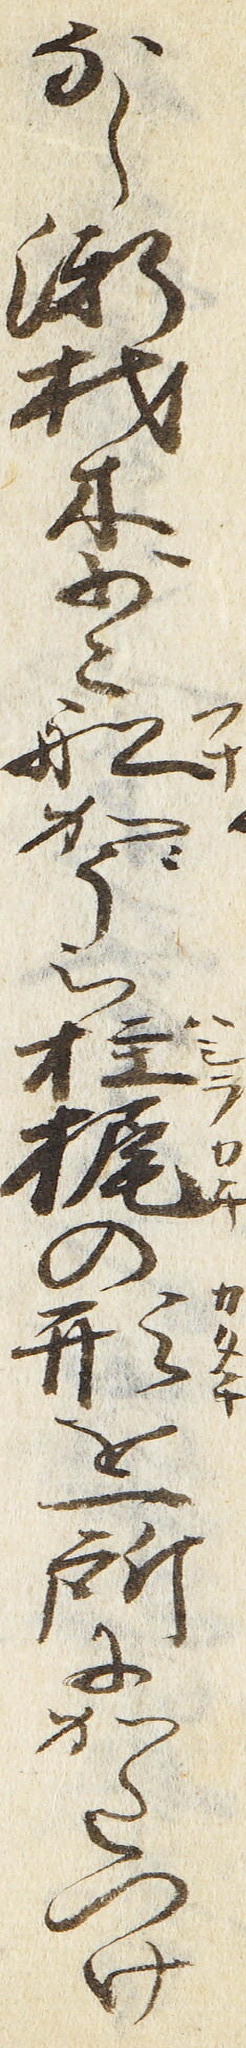なし漸材木少々船がうら柱梶の形を一所にかたつけ
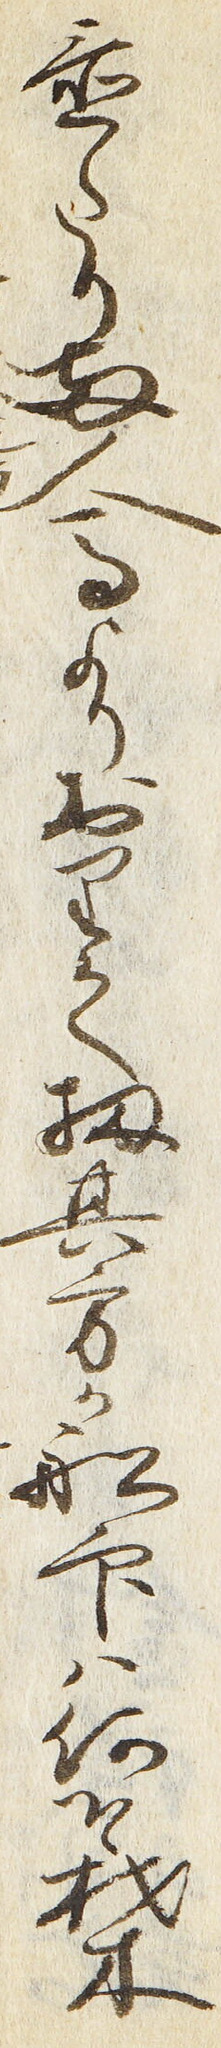置たり両人馬よりおりて扨其方か船印ハ何そ材木
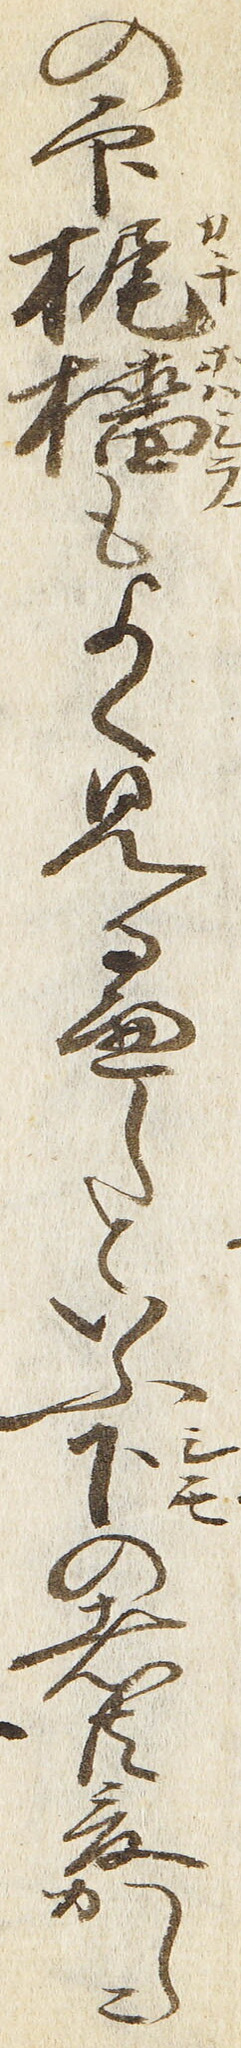の印梶檣もよく見るへしといふ下の者共爰かしこ
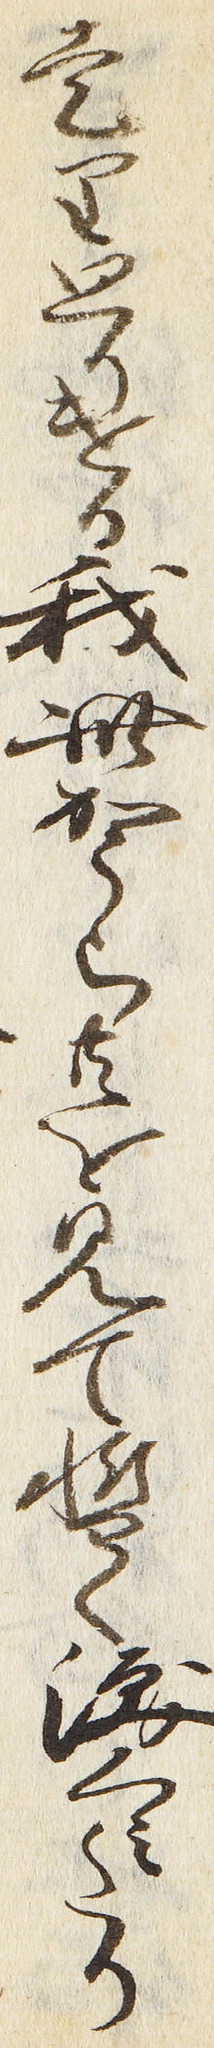走り廻りける我此かうら共を見て暫く涙くみたり
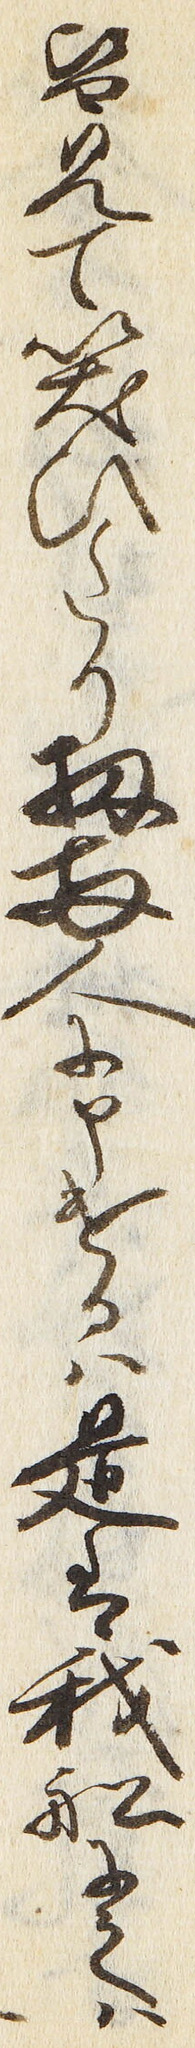皆見て笑ひたり扨両人に申けるハ是は我船にては
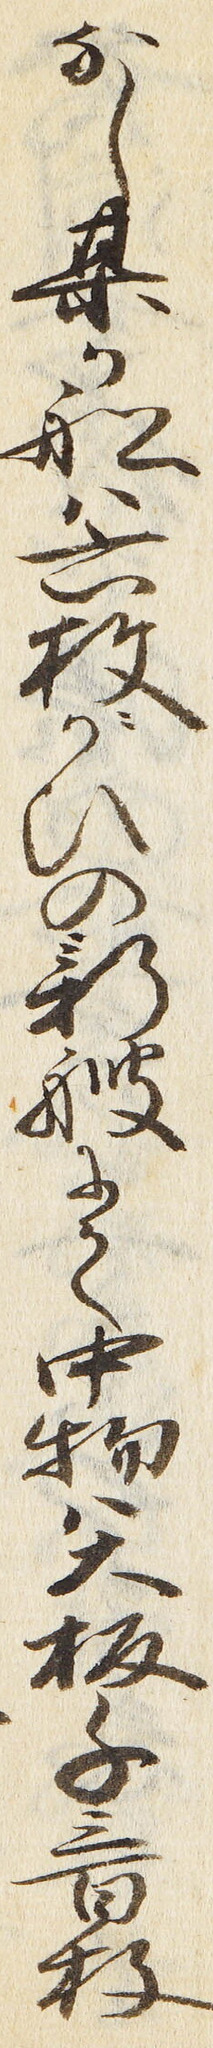なし某か船は六枚ニがひの新艘にて中物は大板千三百枚
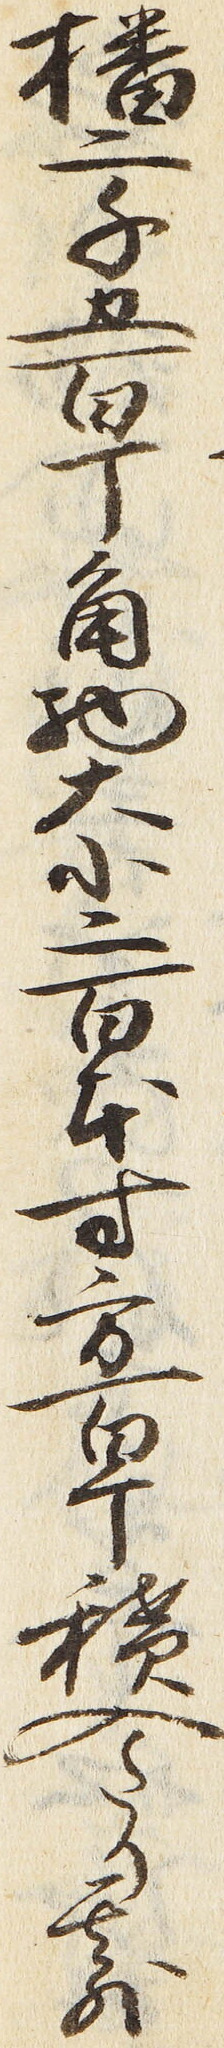橎二千五百丁角物大小二百本寸法百丁積入たり其外
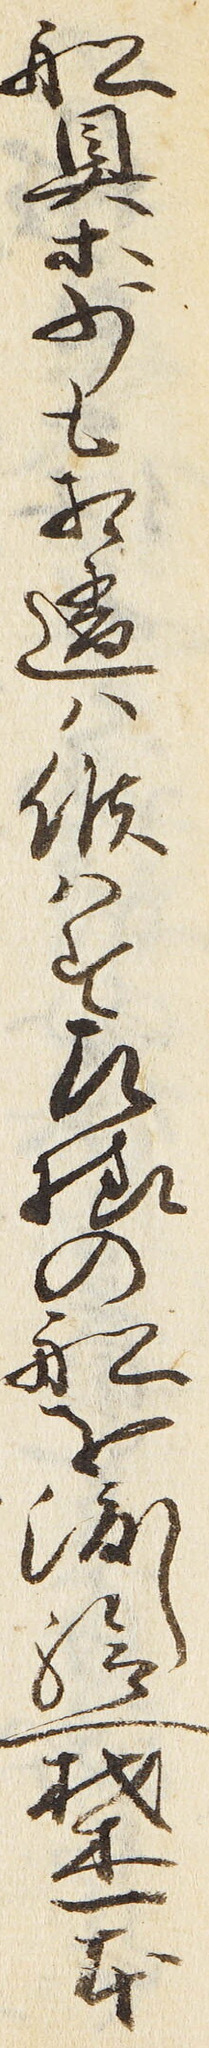船具等少も相違は候はす左様の船を渡し給へ材木一本
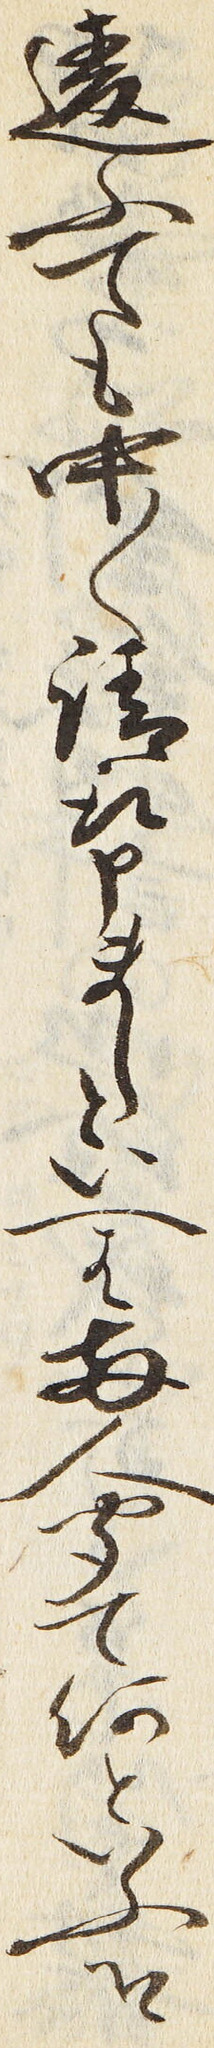違ふても中〳〵請取申ましといへは両人聞て何といふそ
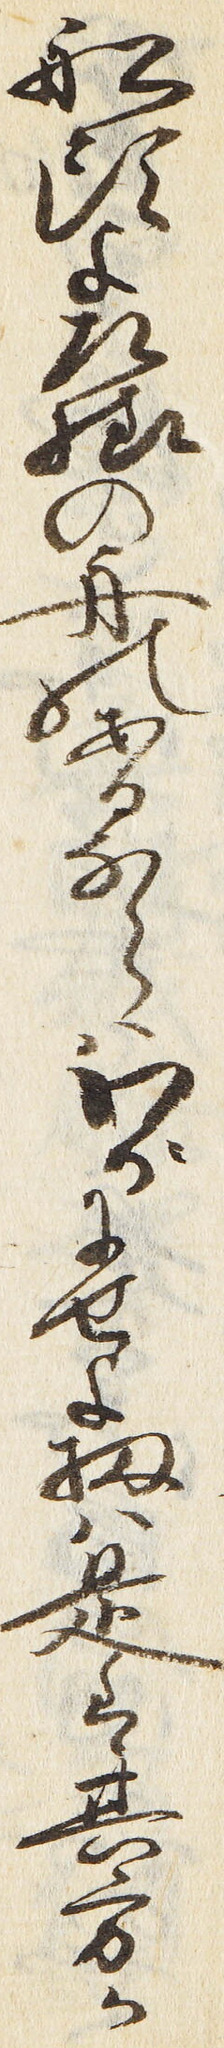船頭に左様の舟のあるならはわがにせよ扨は是は其方か
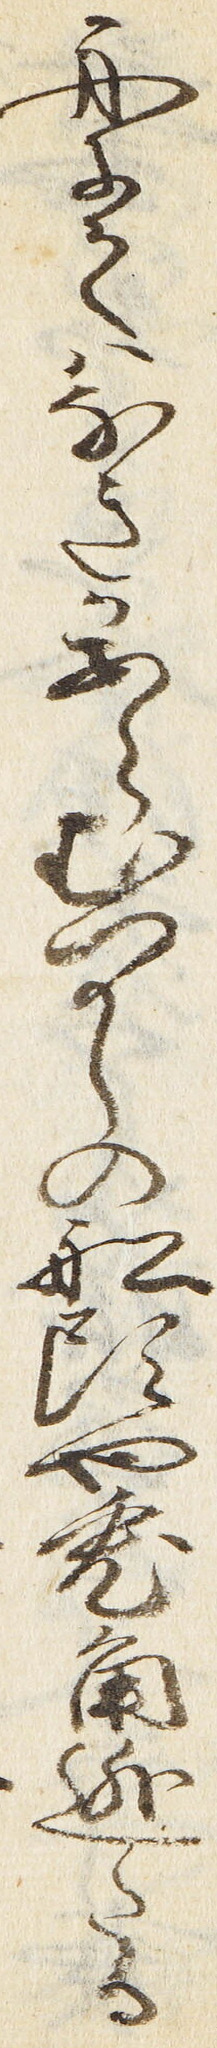舟にてはなきかあらむつかしの船頭也兎角逃たる
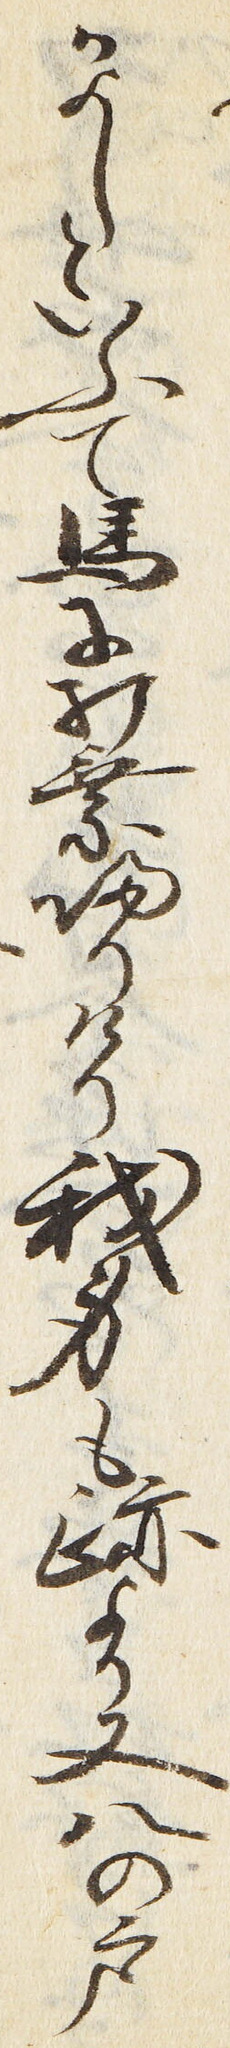かよしといふて馬に打乗帰りけり我身も跡より又八の戸
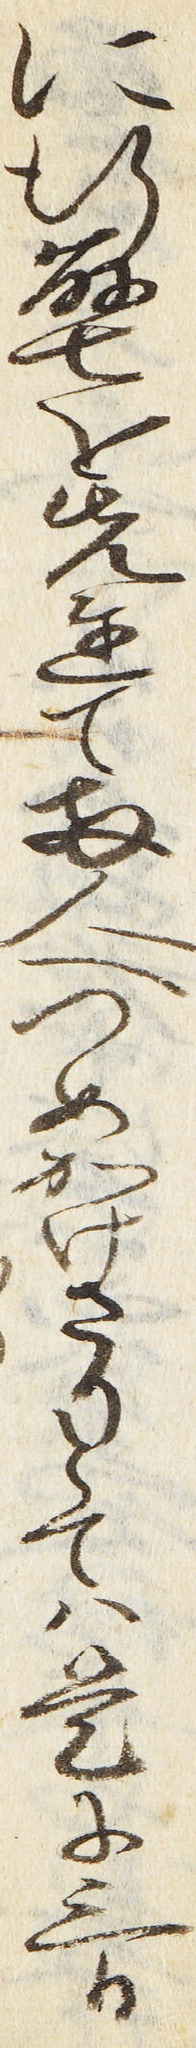に行藤七を先達て両人へつめかけさりとては是に三日
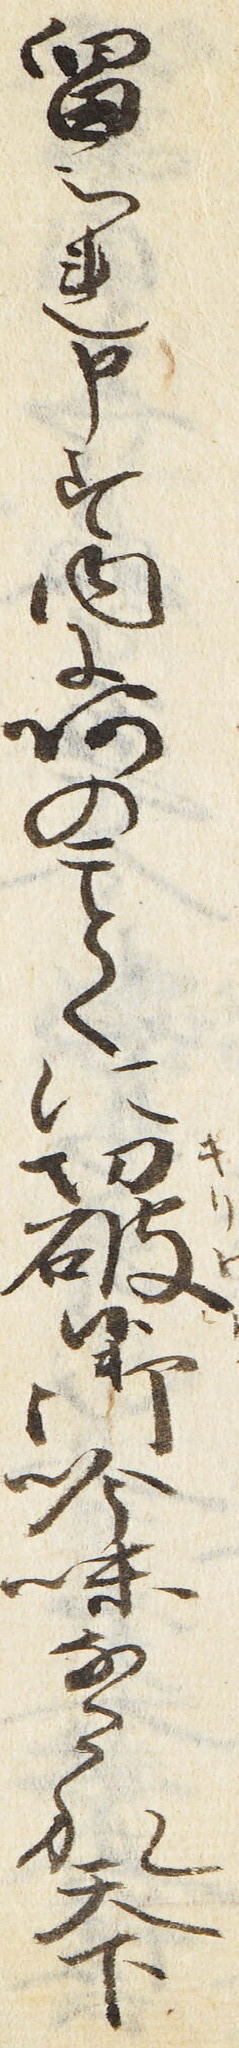留られ申す内にあのことくに切破候御吟味なされ天下
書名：海陸世話日記
